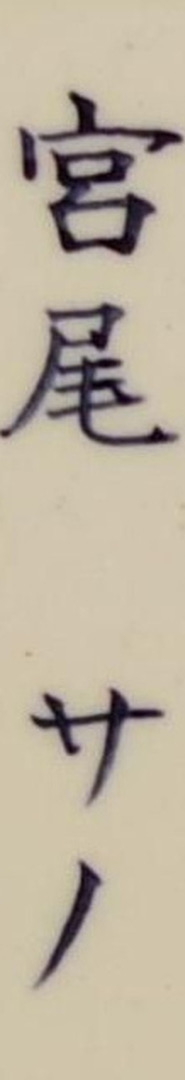宮尾サノ
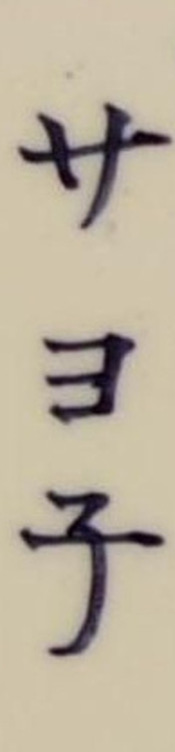サヨ子
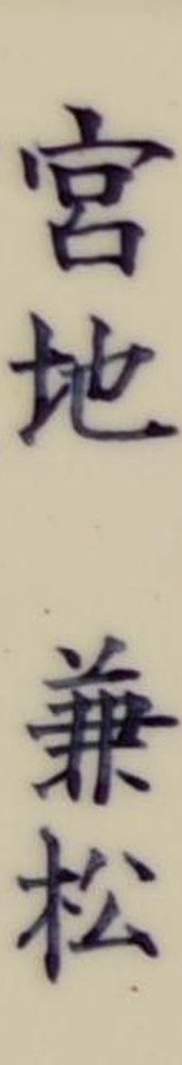宮地兼松
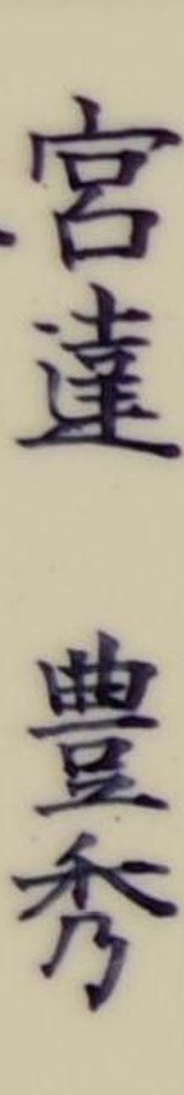宮達豊秀
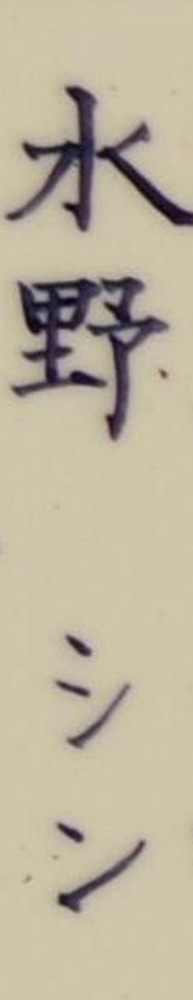水野シン
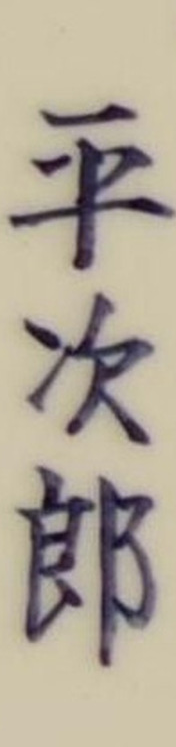平次郎
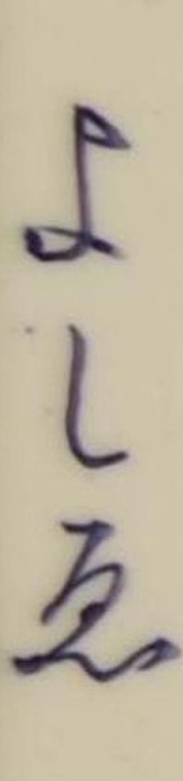よしゑ

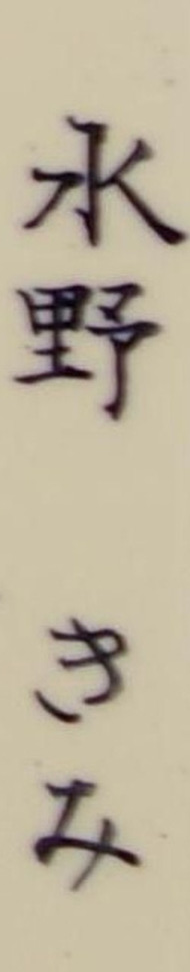水野きみ
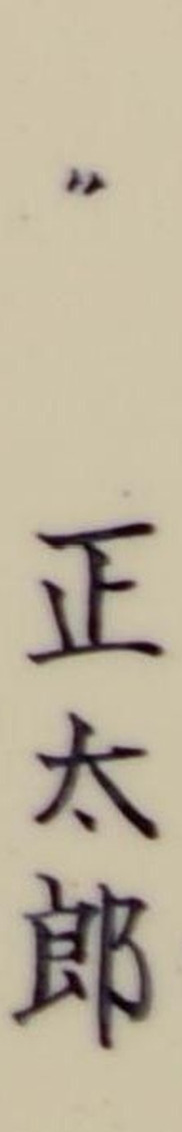正太郎
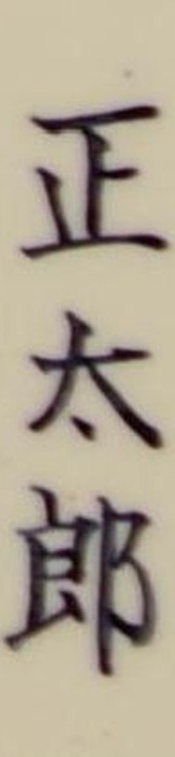正太郎
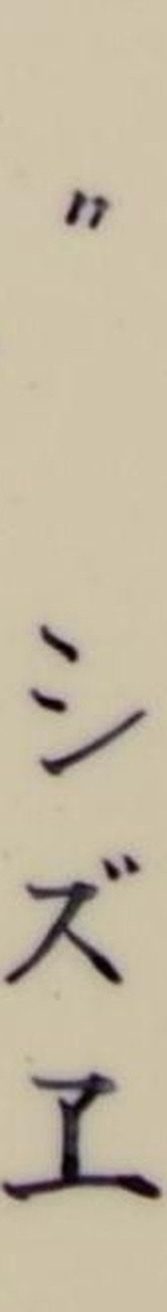シズヱ
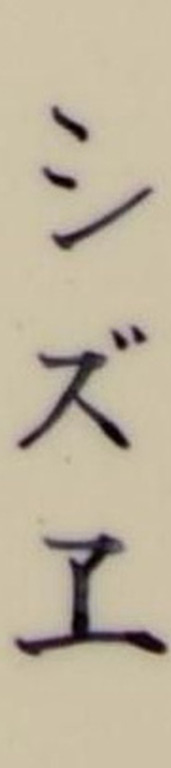シズヱ
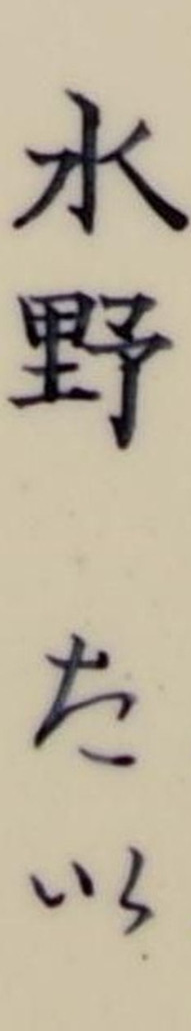水野たい
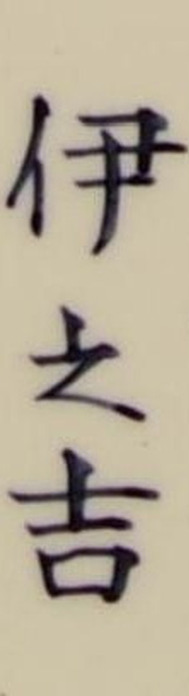伊之吉
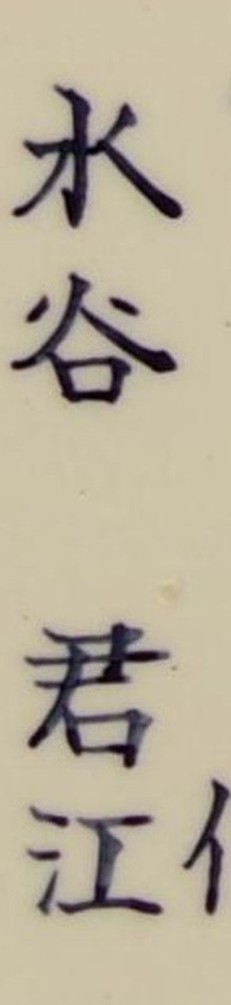水谷君江
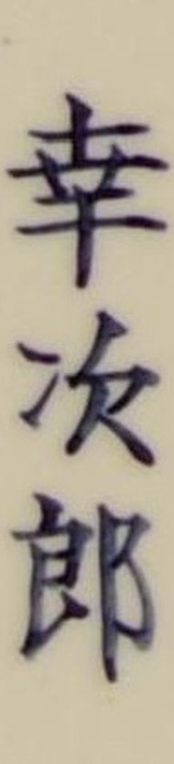幸次郎
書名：E~L
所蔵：高野山金剛峯寺
